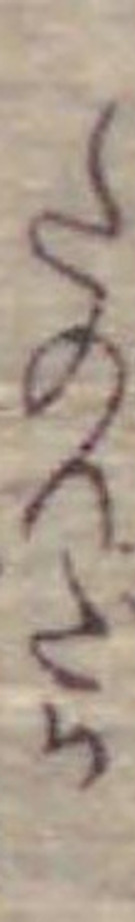たのんだか
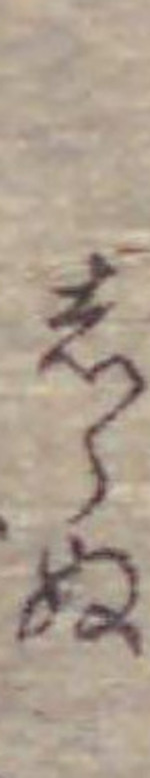しらぬ
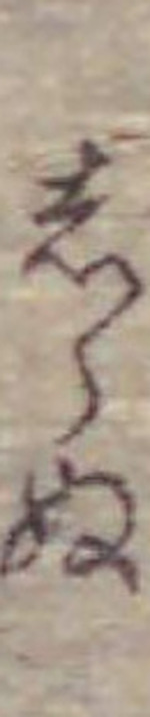しらぬ
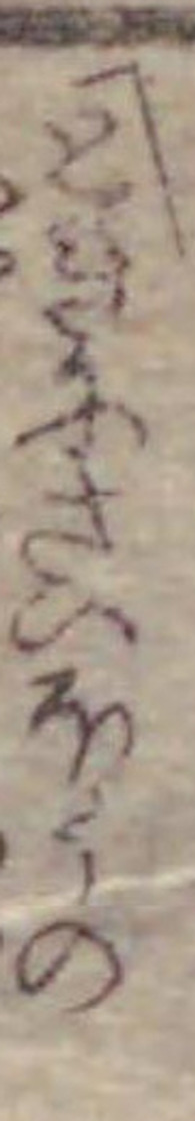〽ときにさいほうの
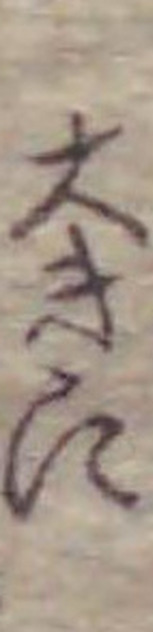大きに
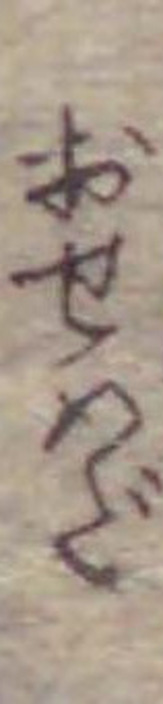おせはだ
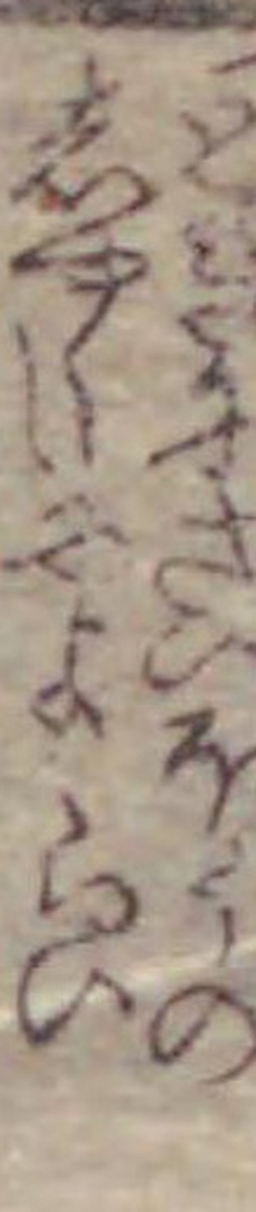しやくしによらい
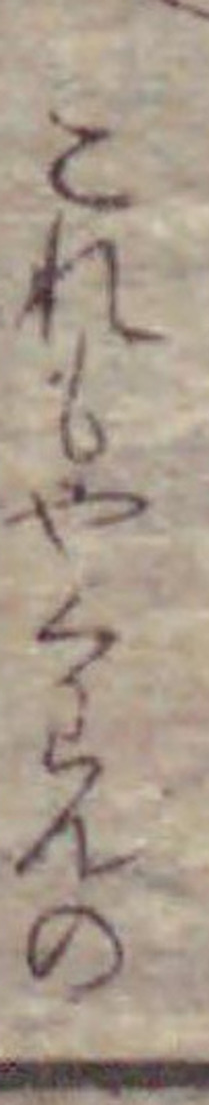これもやくわんの
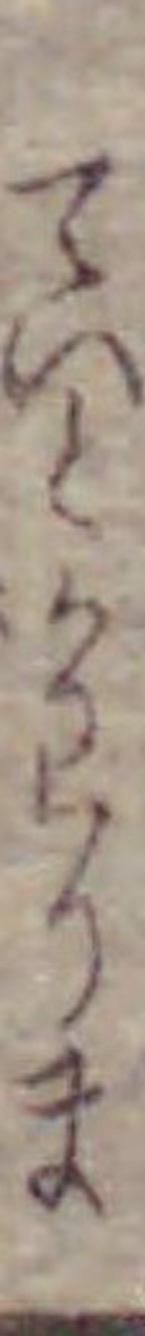ていとかわりま
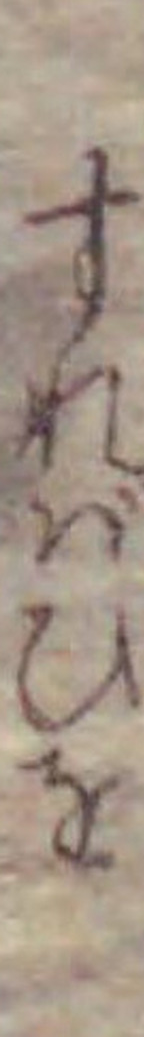すればひを
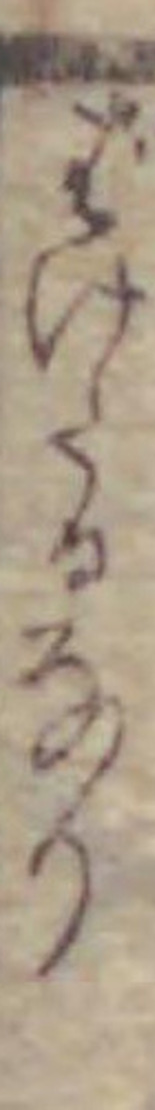ばけたるなり
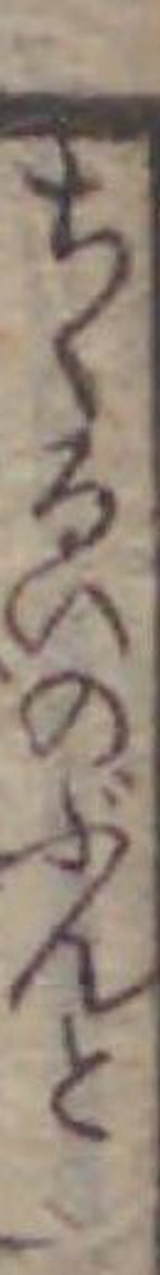ちくるいのぶんと
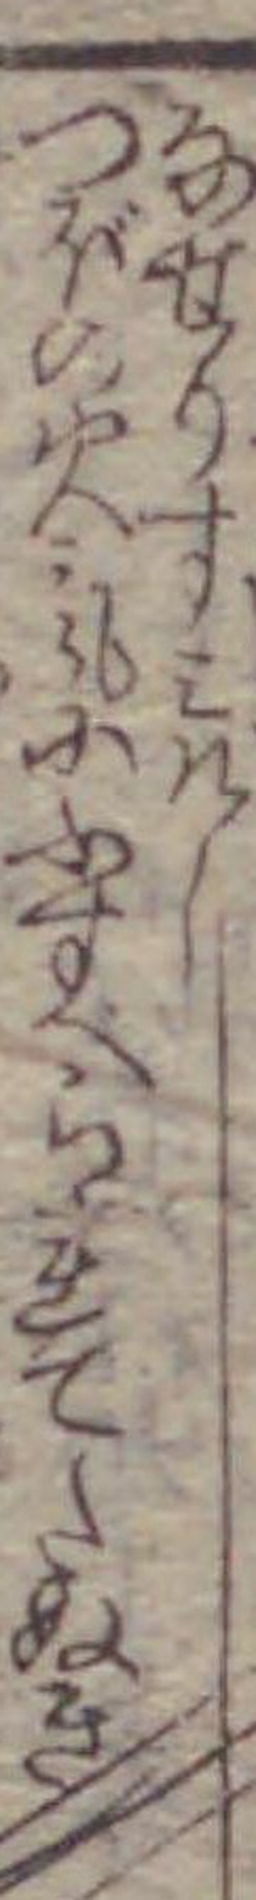つぼの火気にふすへられてたぬき
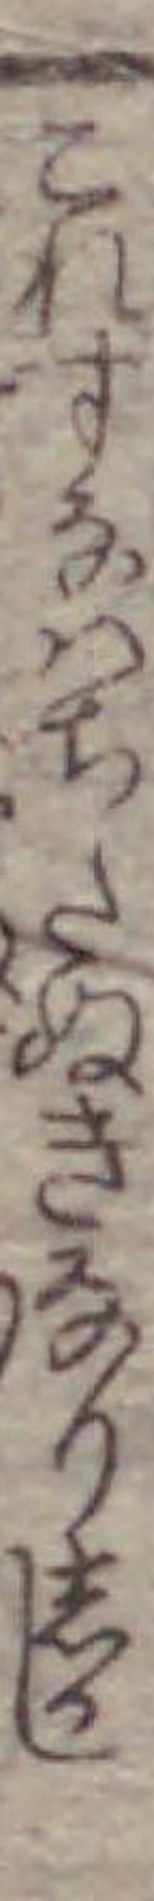これすなはちたぬきなりしかし
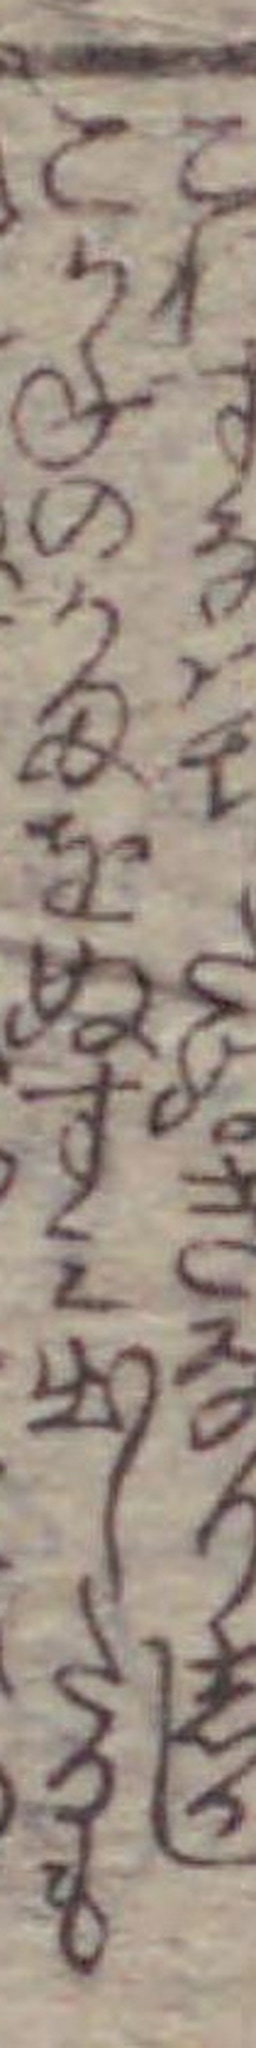こかねのかまをぬすみ出したるも
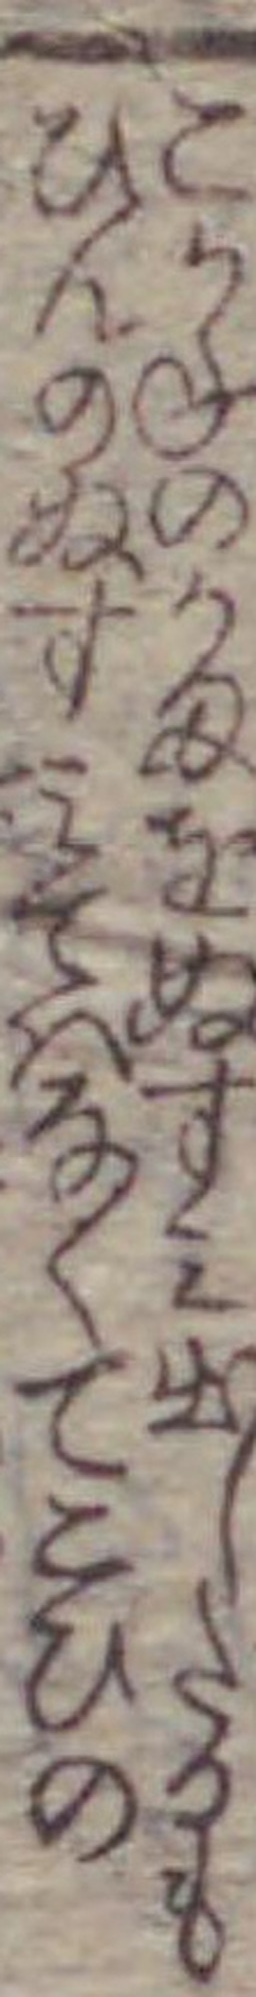ひんのぬすみてはなくてこひの
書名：万物小遣帳 : 2巻
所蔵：国立国会図書館 National Diet Library, JAPAN
